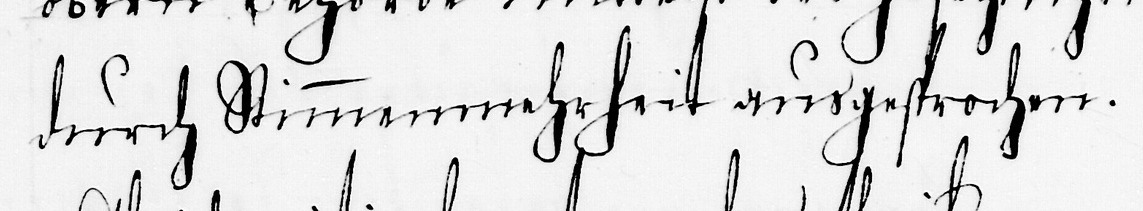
durch Stimmenmehrheit ausgesprochen.
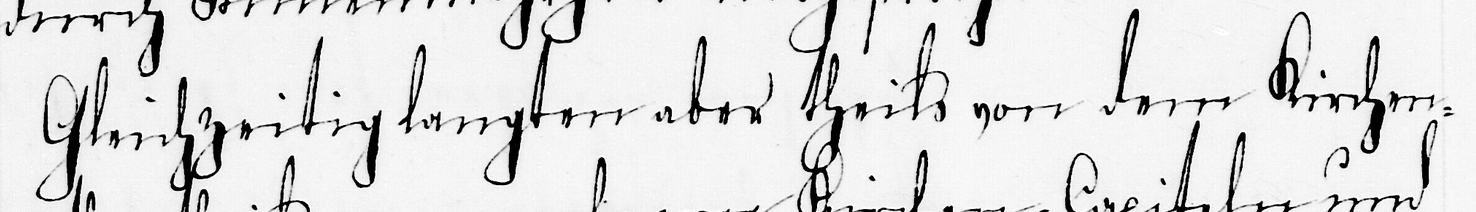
Gleichzeitig langten aber theils von dem Kirchen¬
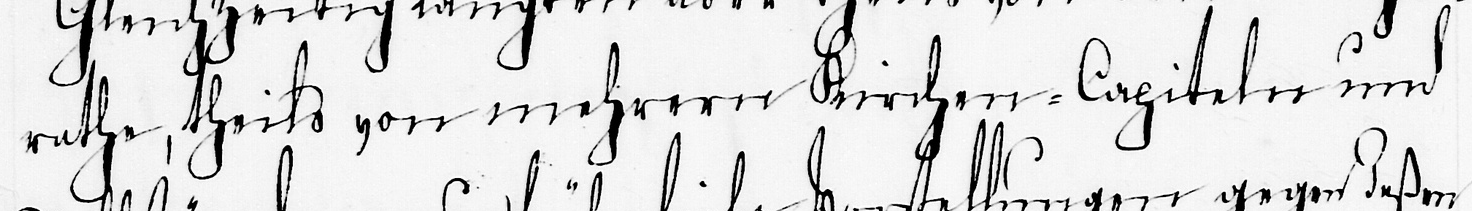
rathe, theils von mehrern Kirchen-Capiteln und
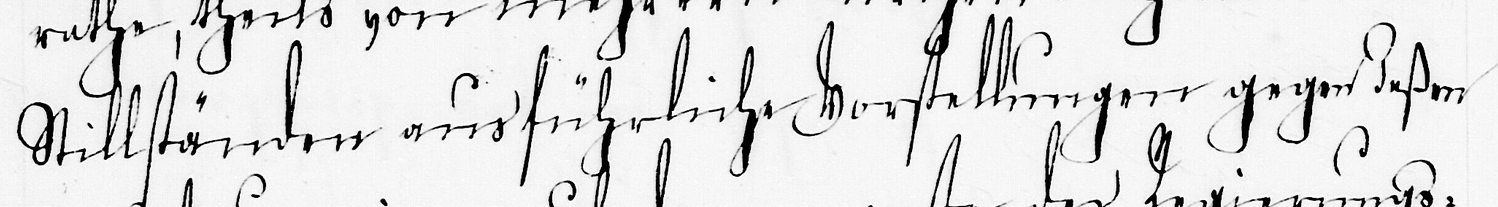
Stillständen ausführliche Vorstellungen gegen deßen
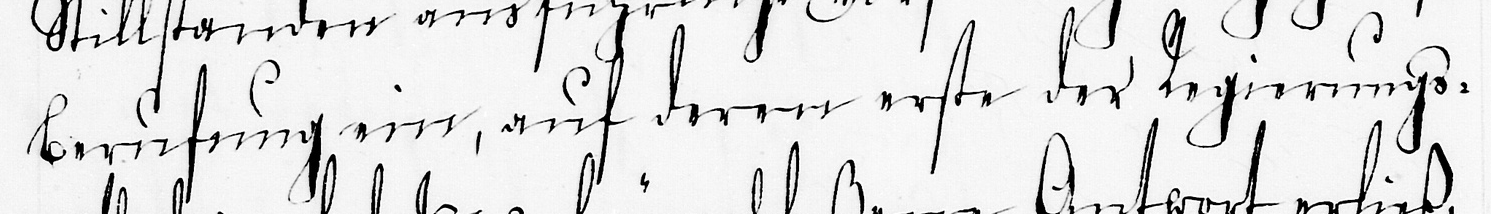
Berufung ein, auf deren erste der Regierungs¬
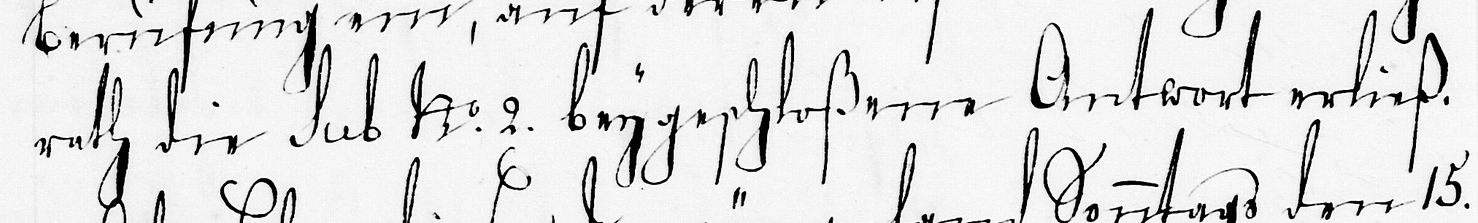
rath die sub No. 2. beygeschloßene Antwort erließ.
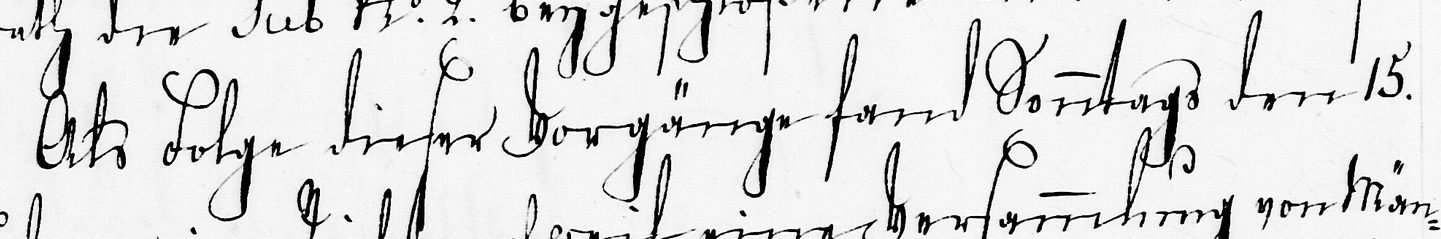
Als Folge dieser Vorgänge fand Sonntags den 15.
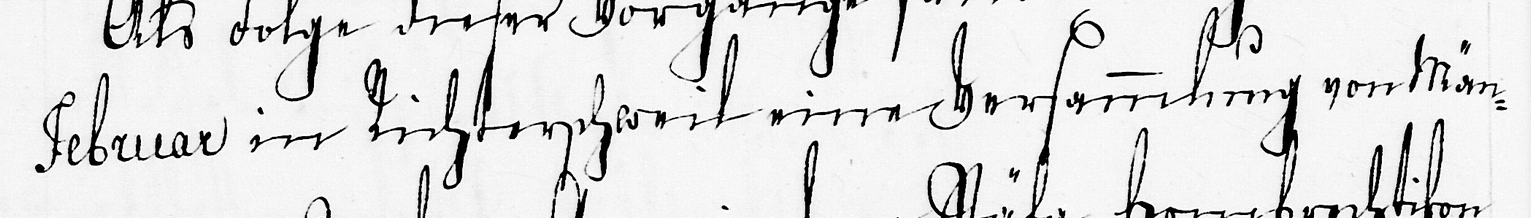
Februar in Richterschweil eine Versammlung von Män¬
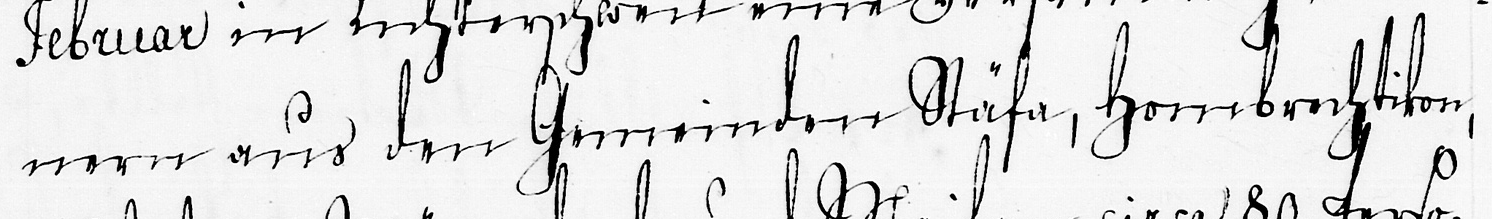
nern aus den Gemeinden Stäfa, Hombrechtikon,
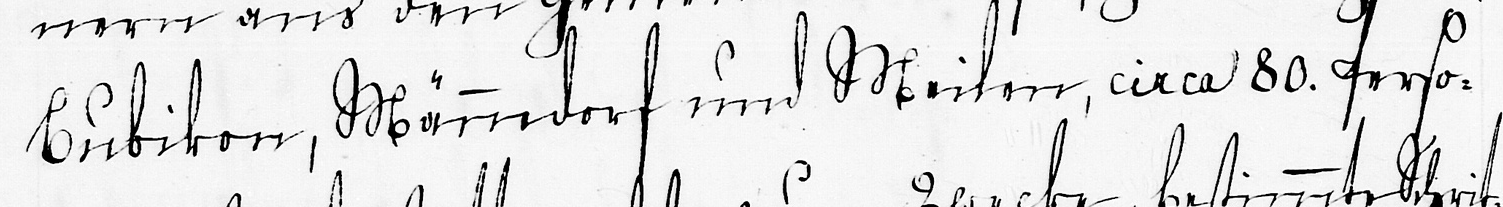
Bubikon, Männedorf und Meilen, circa 80. Perso¬
